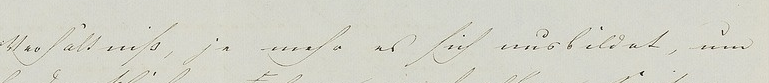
Verhältniß je mehr es sich ausbildet, um
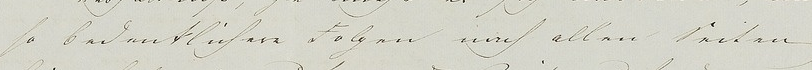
so bedenklichere Folgen nach allen Seiten
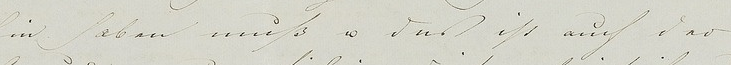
hin haben muß & das ist auch der
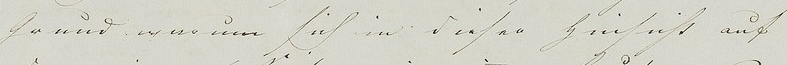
Grund warum sich in dieser Hinsicht auf
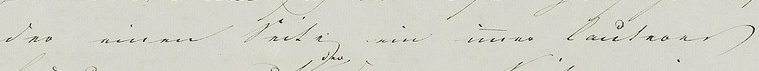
der einen Seite ein immer lauteres
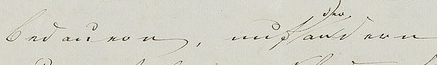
der anderen Seite eine
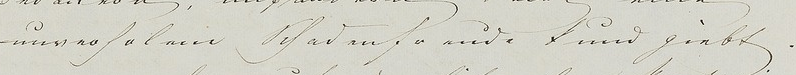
unverholene Schadenfreude kund giebt.
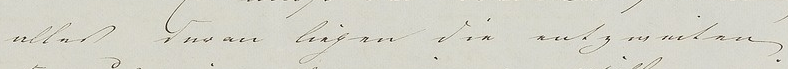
alles daran liegen die entzweiten
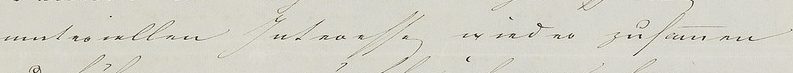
materiellen Interesse wieder zusammen
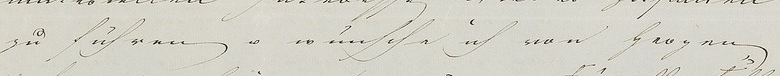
zu führen & wünsche ich von Herzen,
